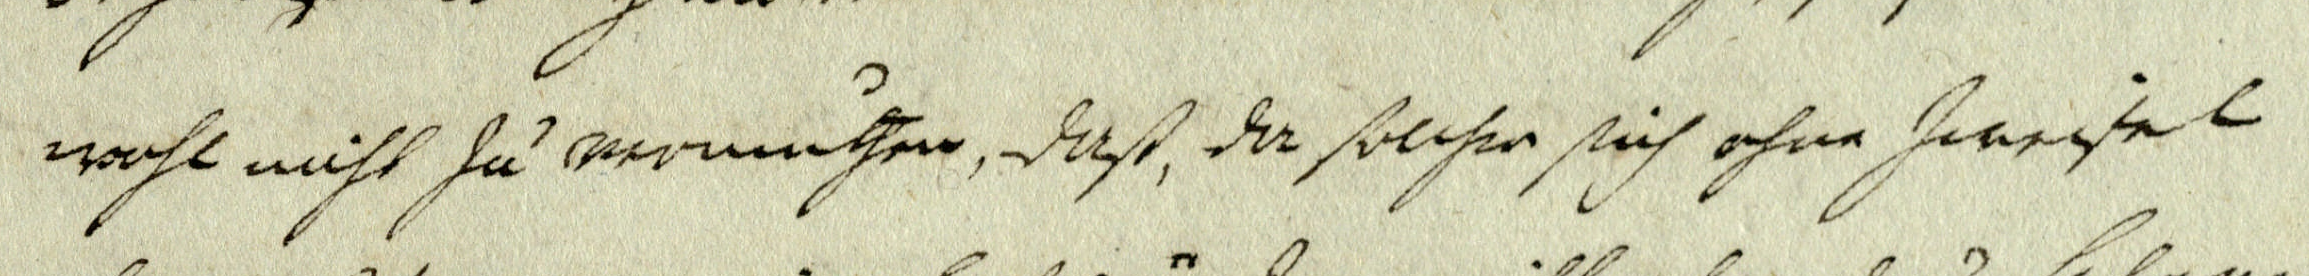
wohl nicht zu vermuthen, daß, da solcher sich ohne Zweifel
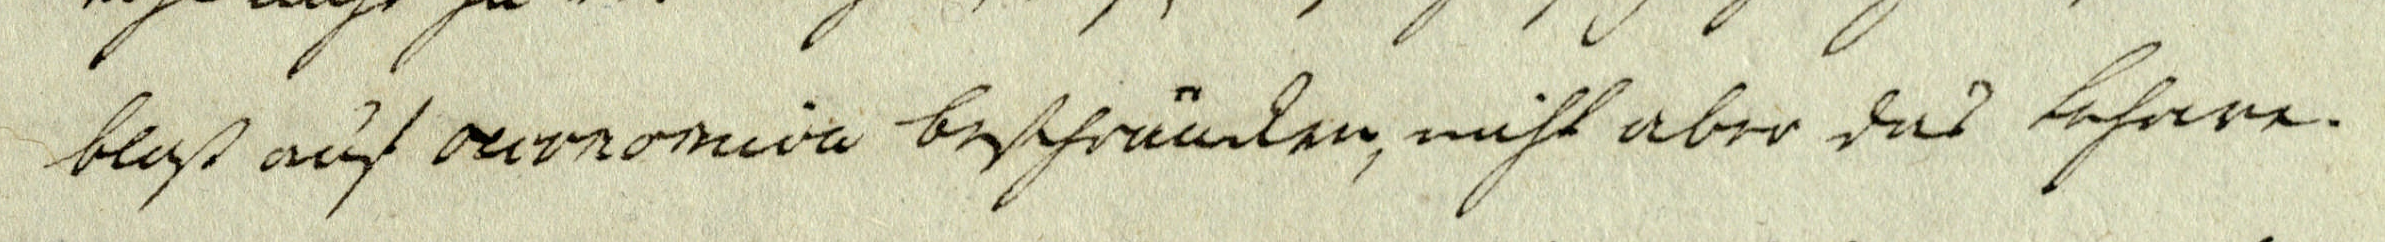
bloß auf oeconomica beschränken, nicht aber das Lehrwe¬
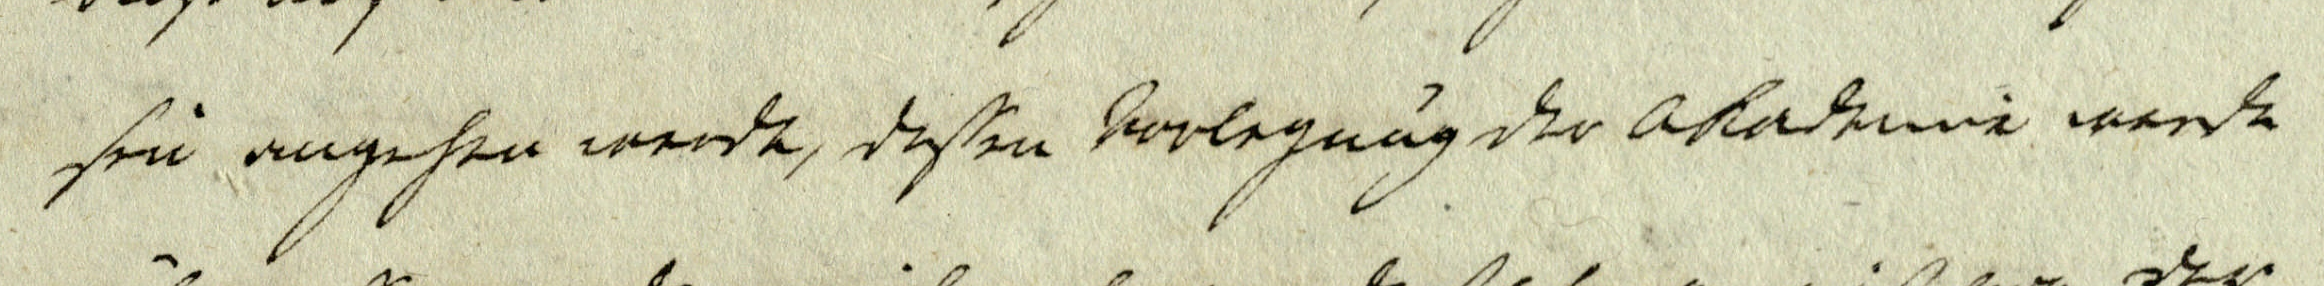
sen angehen werde, dessen Vorlegung der Akademie werde
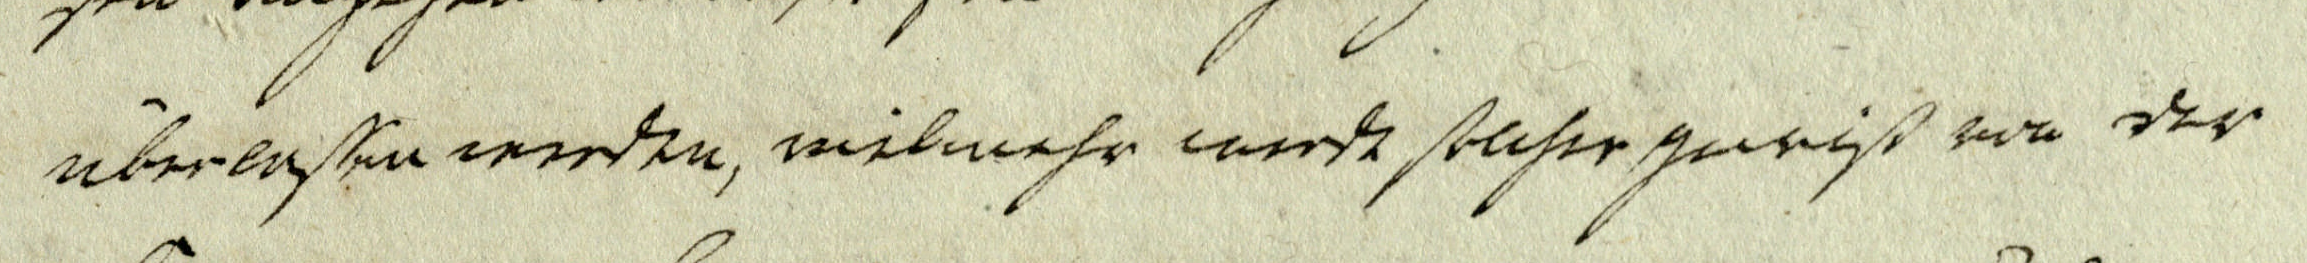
überlassen werden, vielmehr werde solcher gewiß von der
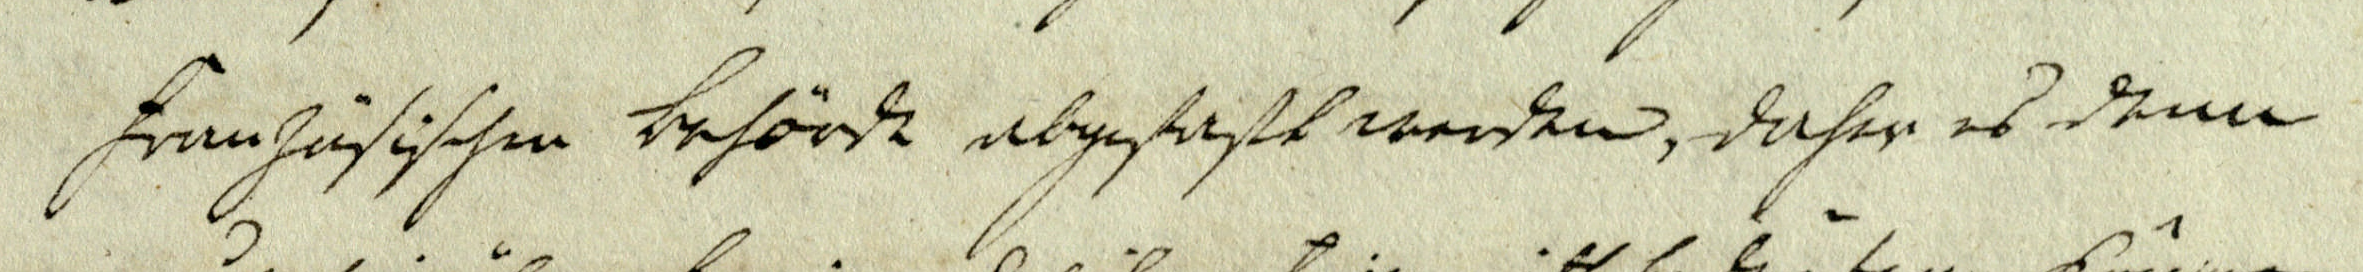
Französischen Behörde abgefaßt werden, daher es denn
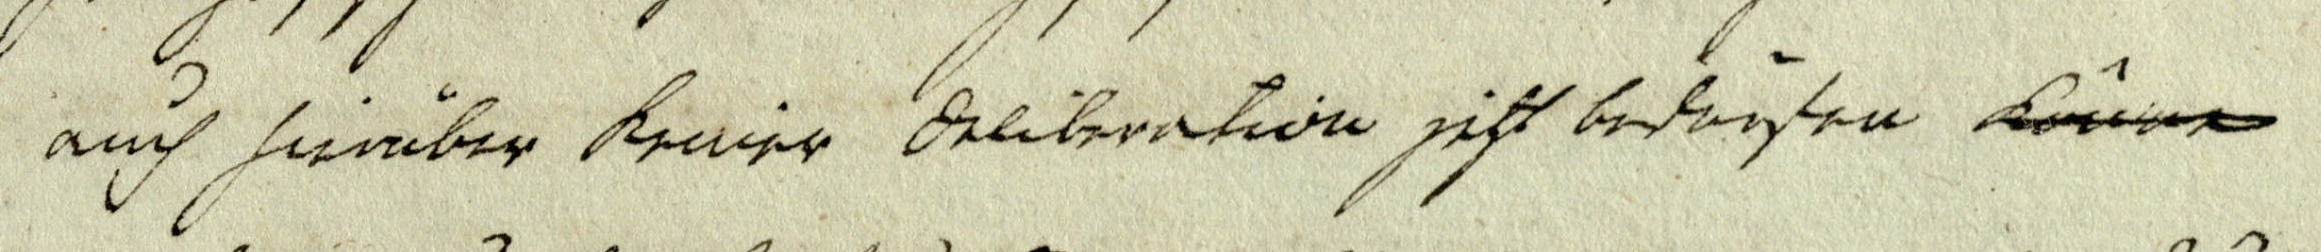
auch hierüber keiner Deliberation jetzt bedürfen könne
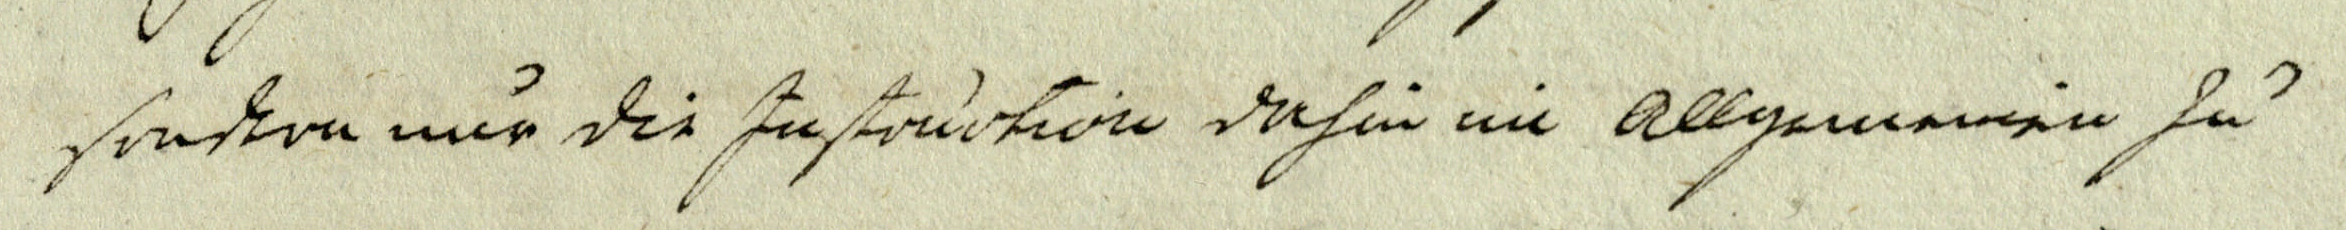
sondern nur die Instruction dahin im Allgemeinen zu
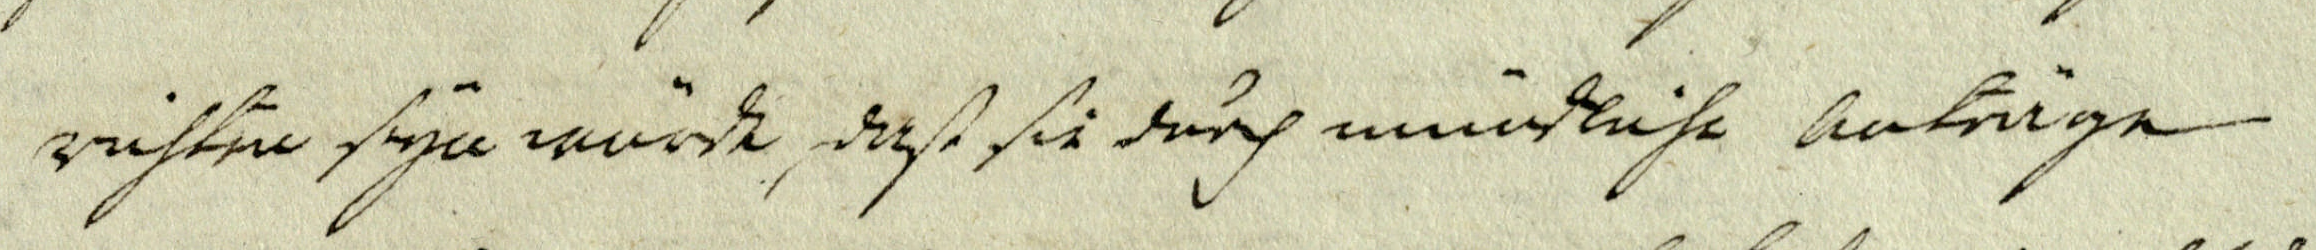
richten seÿn würde, daß sie durch mündliche Anträge
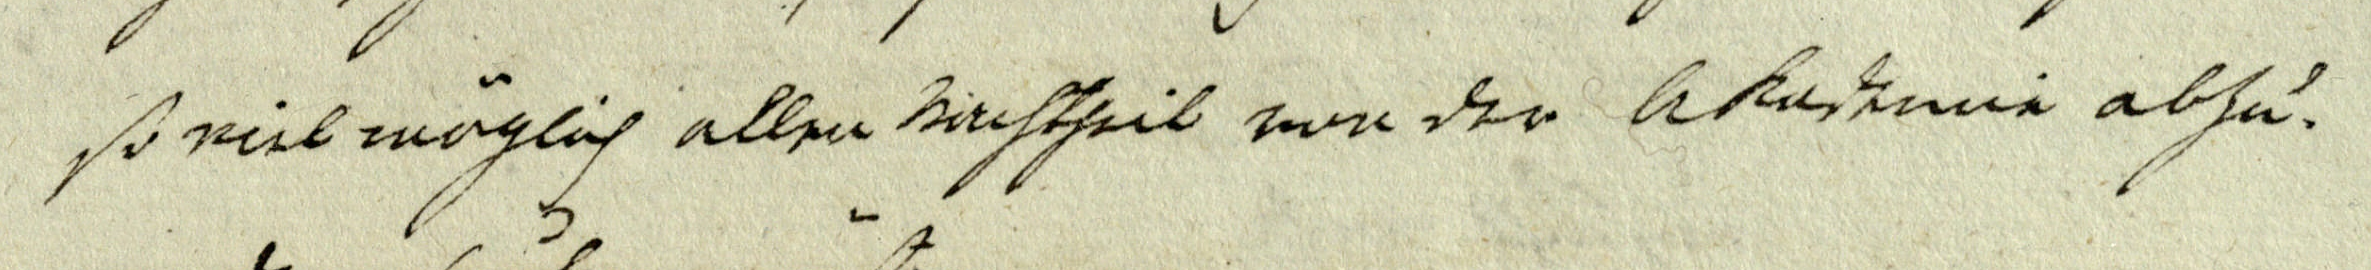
so viel möglich allen Nachtheil von der Akademie abzu¬
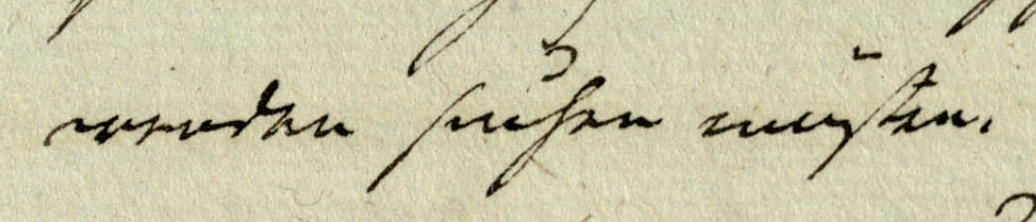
wenden suchen müsten.
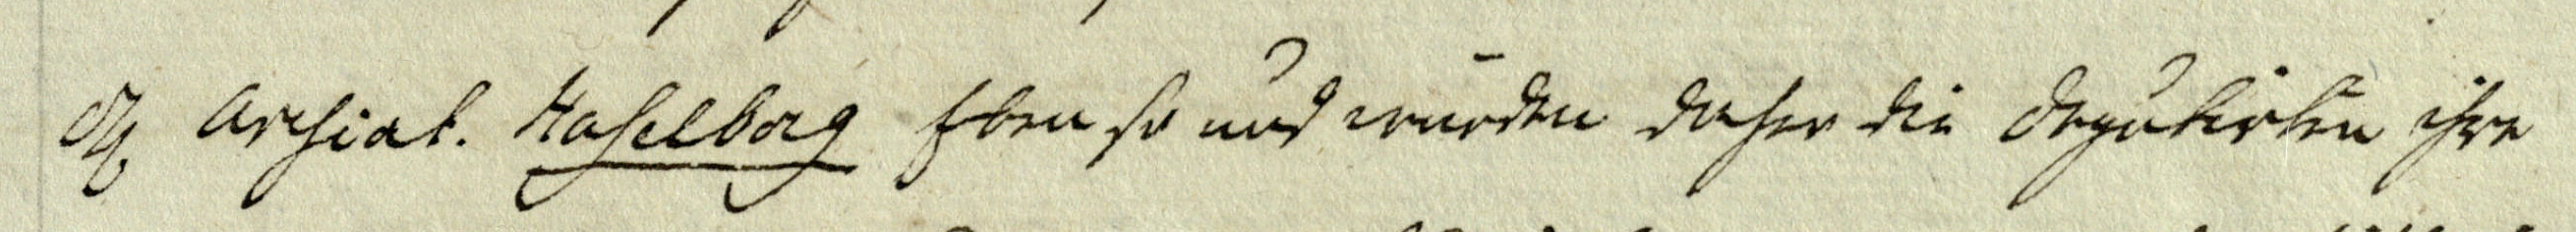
dh. Archiat. Haselberg Ebenso und würden daher die Deputirten ihre
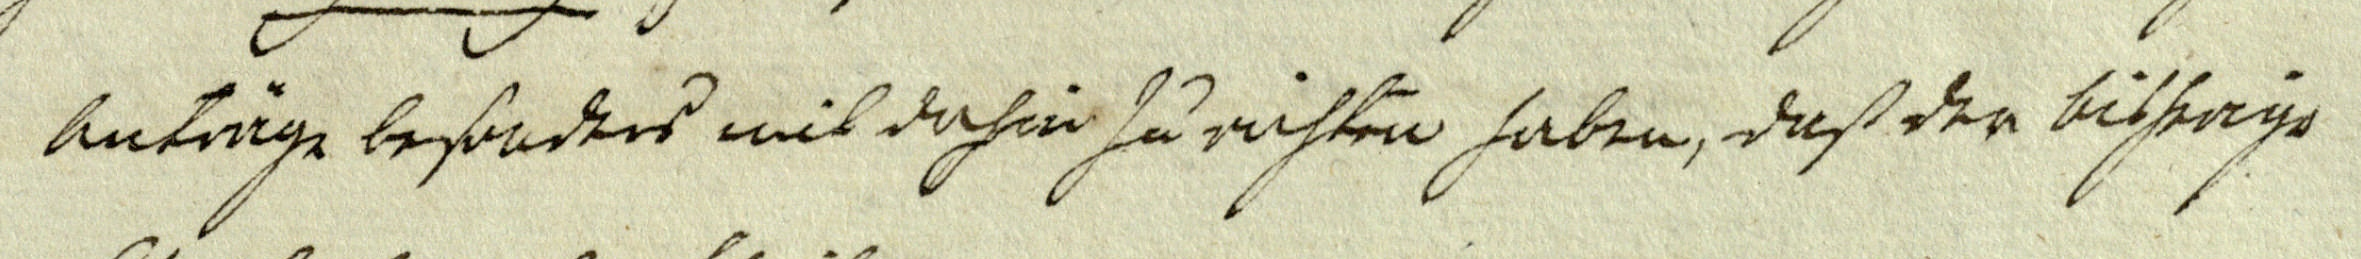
Anträge besonders mit dahin zu richten haben, daß der bisherige
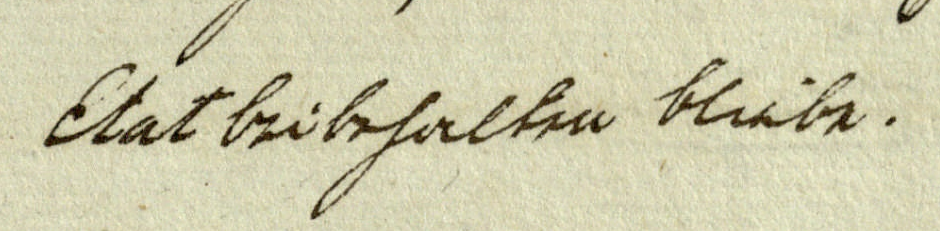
Etat beibehalten bliebe.
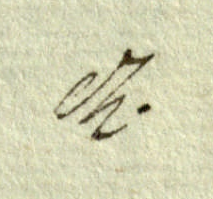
dh
